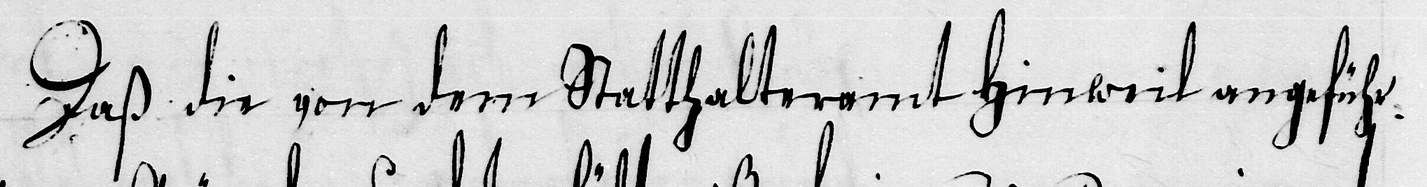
Daß die von dem Statthalteramt Hinweil angeführ¬
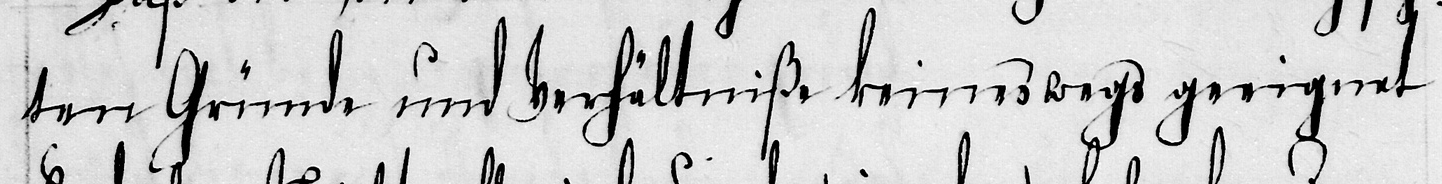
ten Gründe und Verhältniße keineswegs geeignet
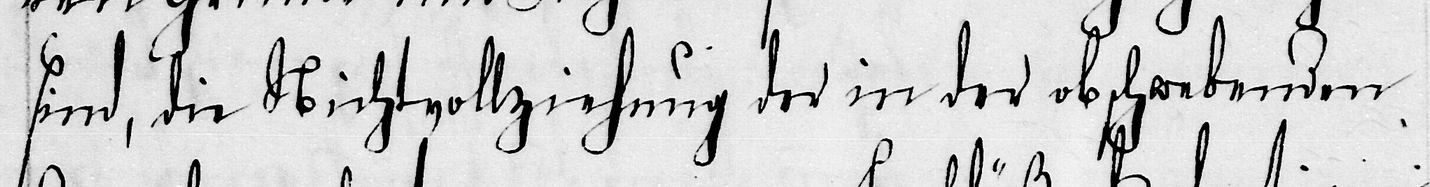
sind, die Nichtvollziehung der in der obschwebenden
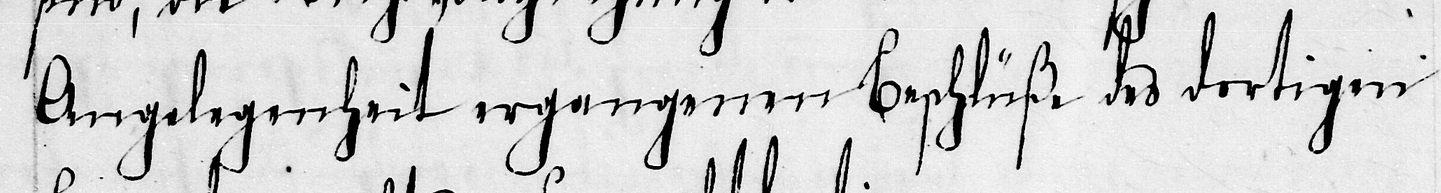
Angelegenheit ergangenen Beschlüße des dortigen
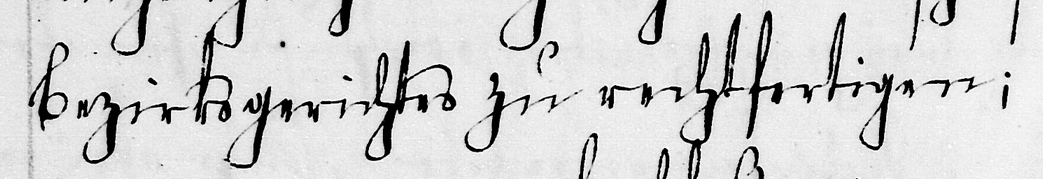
Bezirksgerichtes zu rechtfertigen;
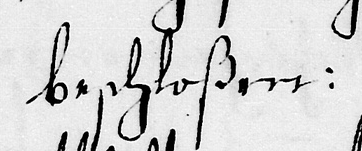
beschloßen:
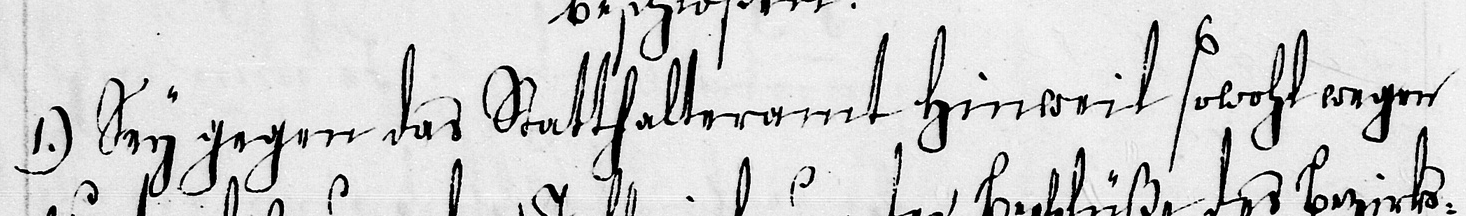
1.) Sey gegen das Statthalteramt Hinweil sowohl wegen
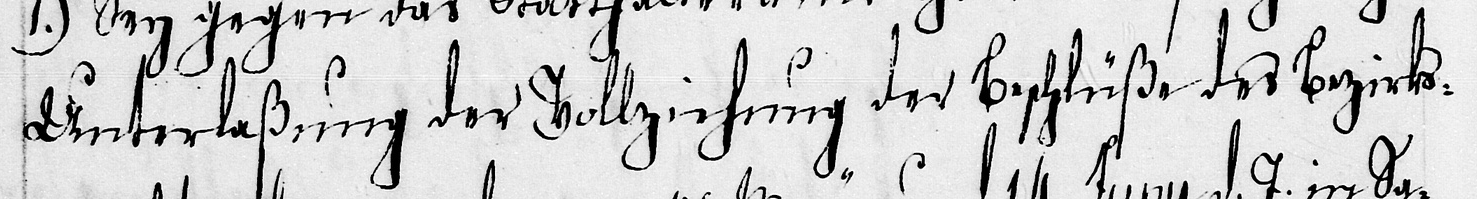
Unterlaßung der Vollziehung der Beschlüße des Bezirks¬
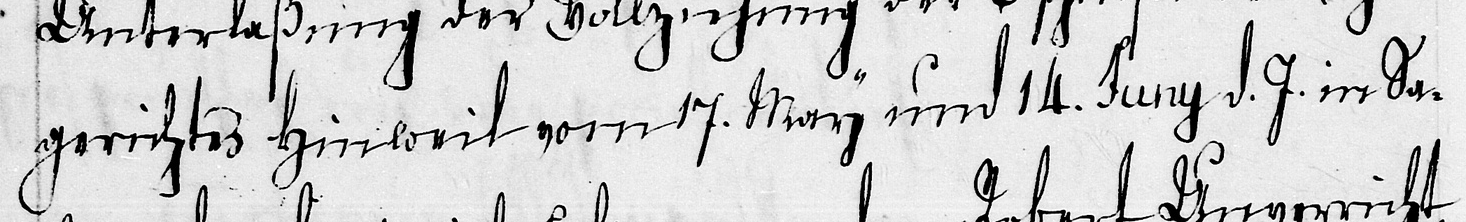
gerichtes Hinweil vom 17. May und 14. Juny d. J. in Sa¬
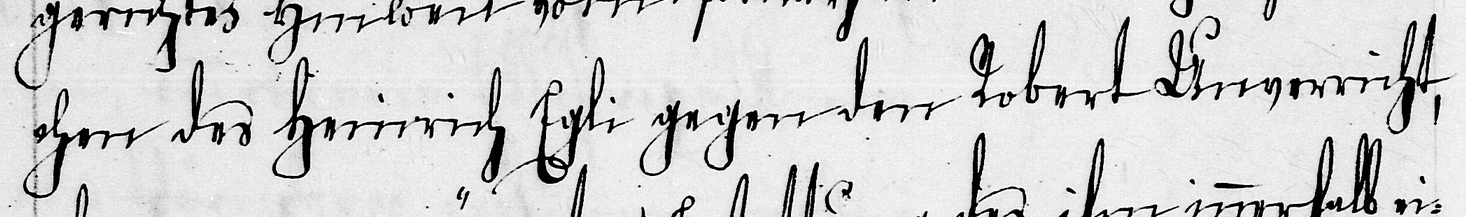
chen des Heinrich Egli gegen den Robert Unverricht,
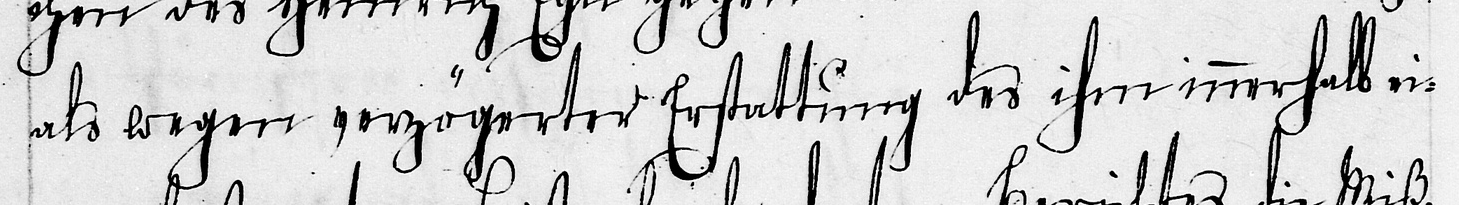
als wegen verzögerter Erstattung des ihm innerhalb ei¬
